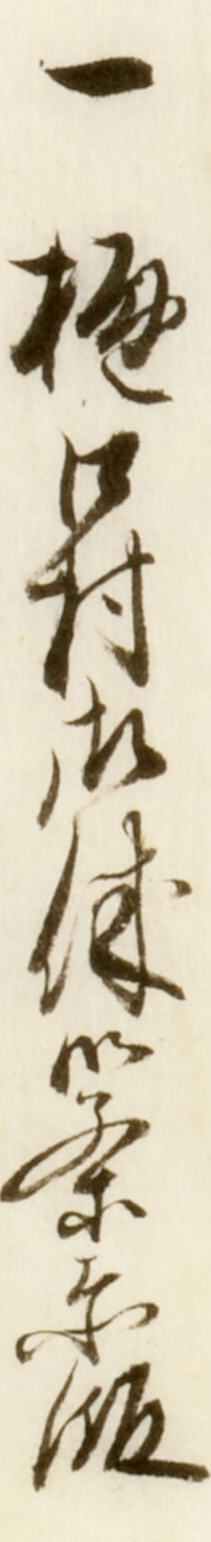一樋口村御休御茶赤飯
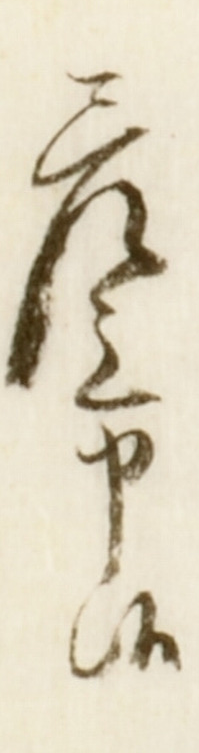差上申候
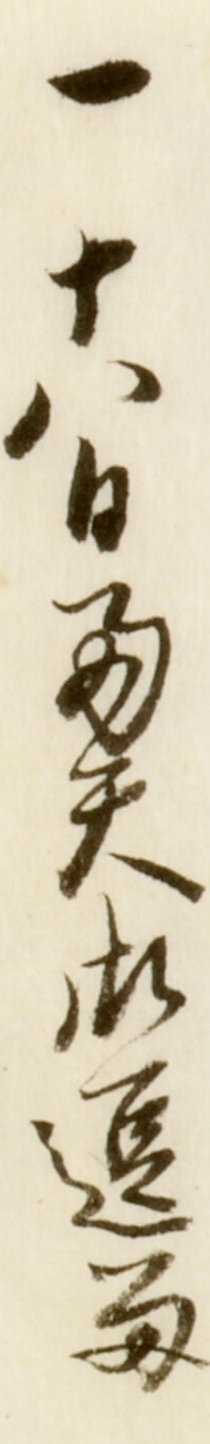一十八日雨天御逗留
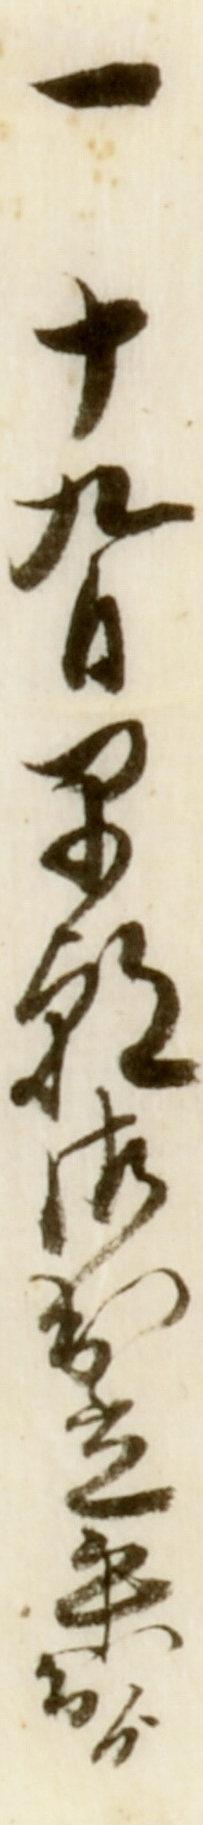一十九日早朝御出立午平出ゟ
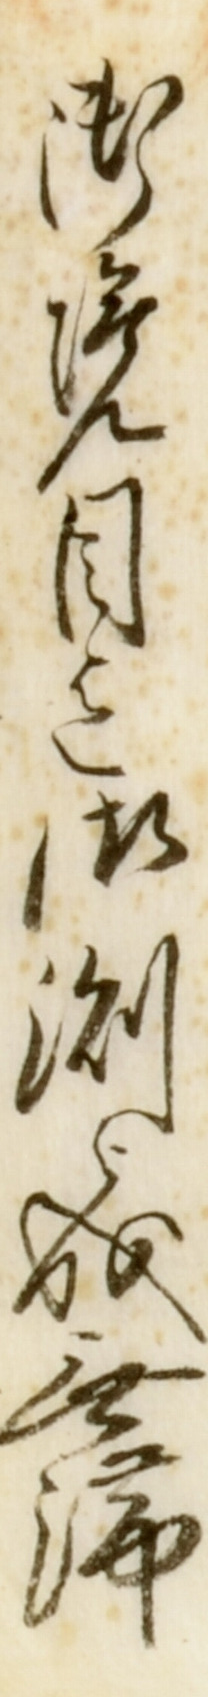御境目迄御測被成無滞

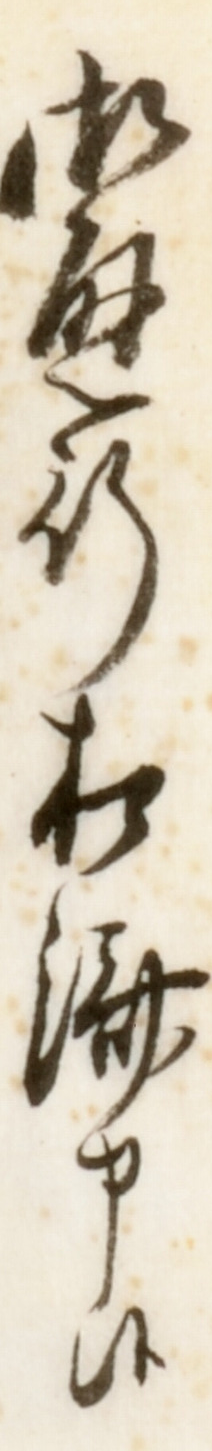御通行相済申候
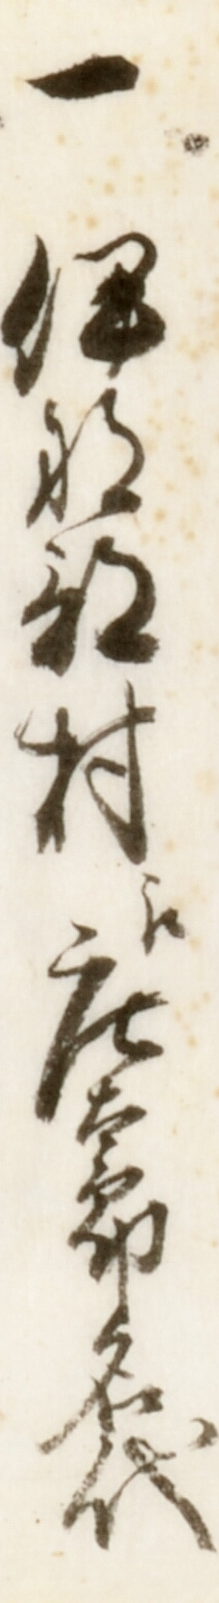一伊那部村江庄五郎名代
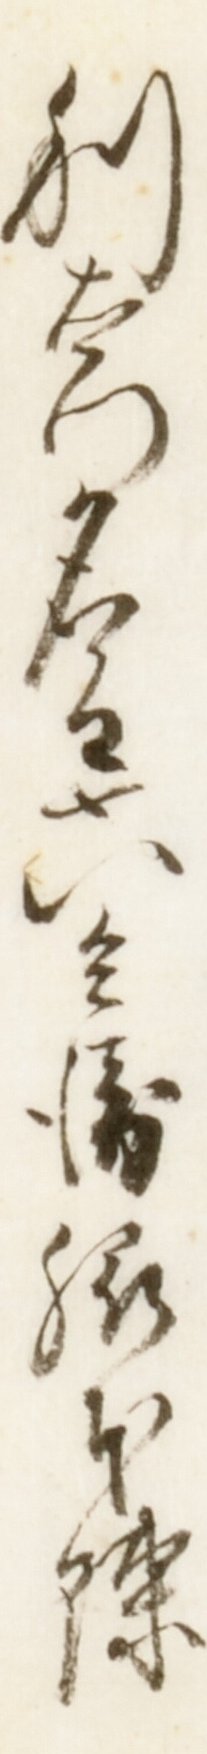利右衛門名主六兵衛脇本陣
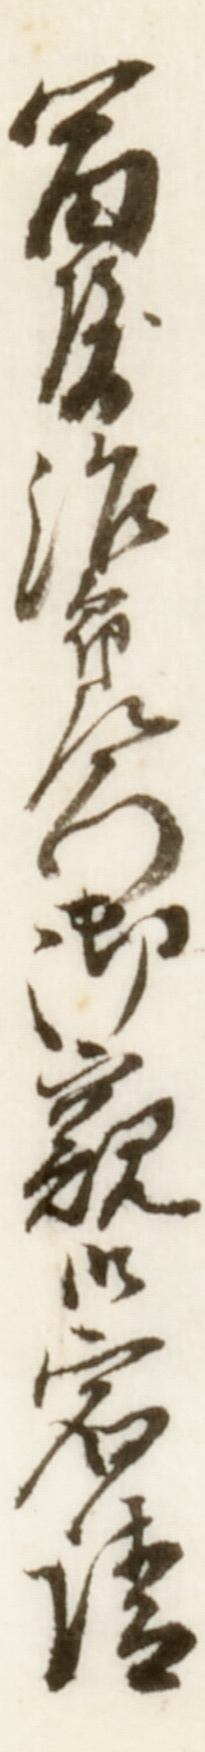富屋治郎左衛門御窺御宿請
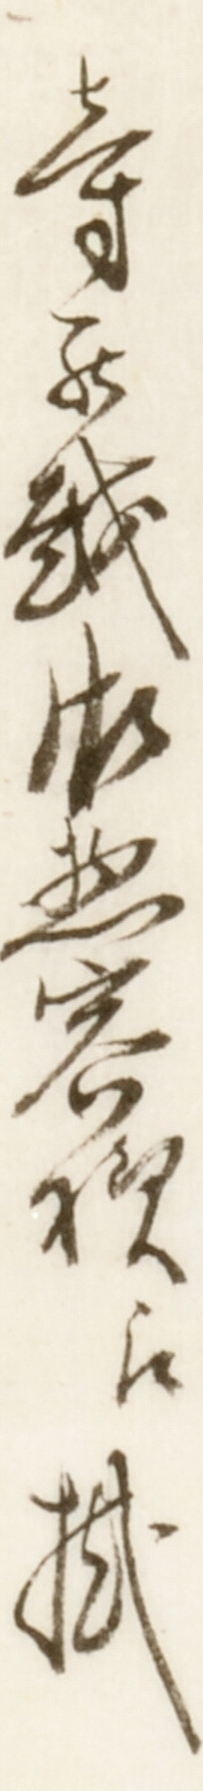旁罷越御惣客様江掛
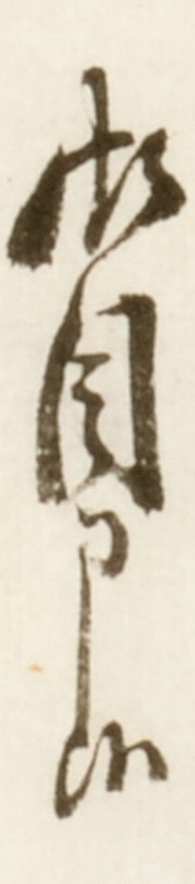御目申候
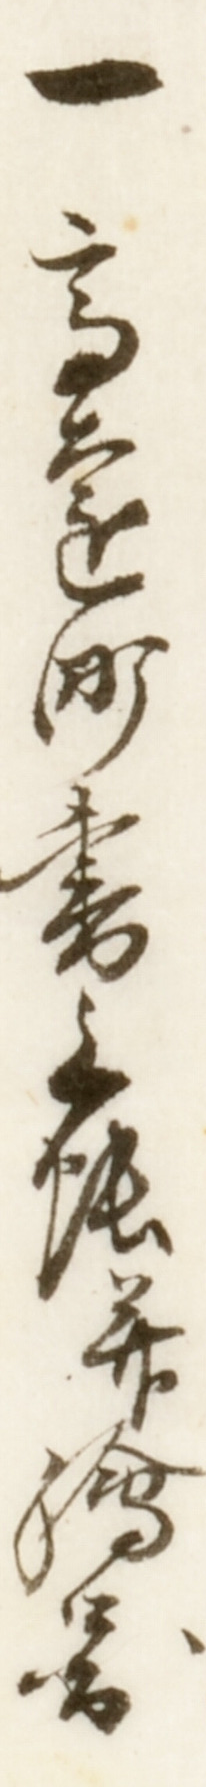一高遠町書上帳並絵図
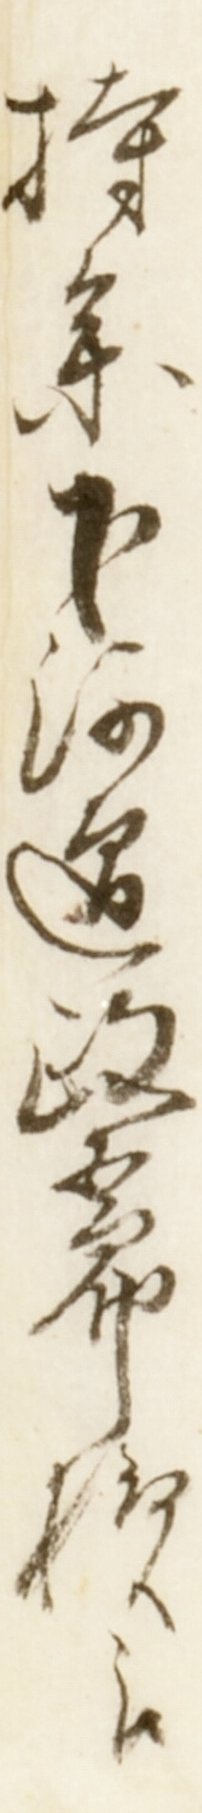持参下河辺政五郎様江
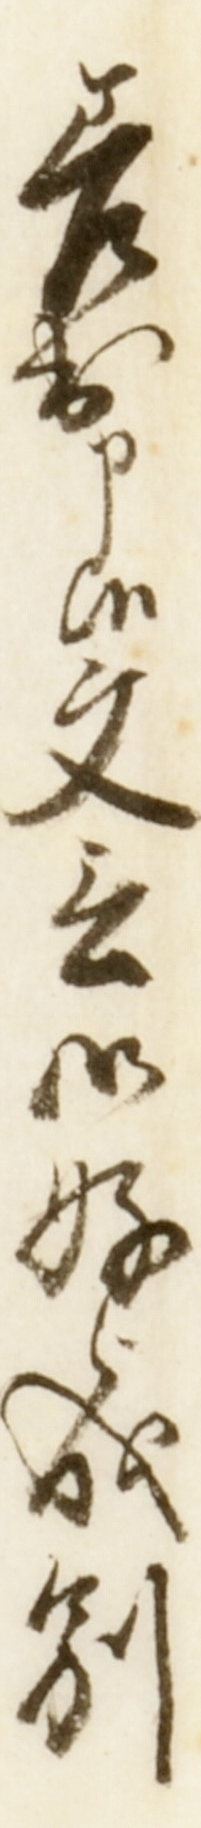差出申候文言御好被成別
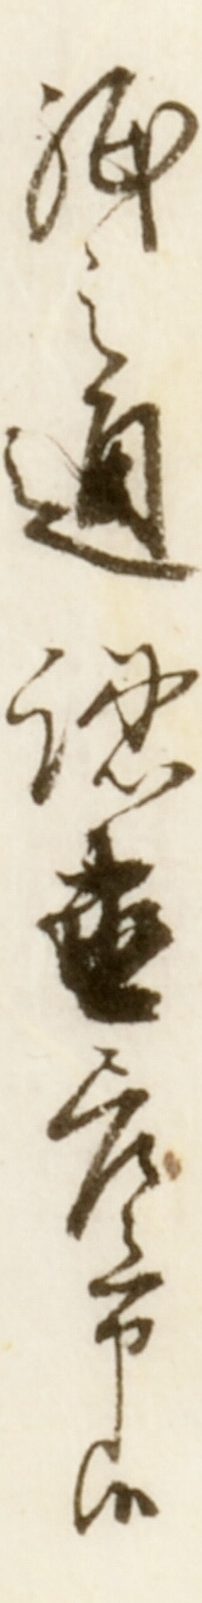紙之通認直差上申候
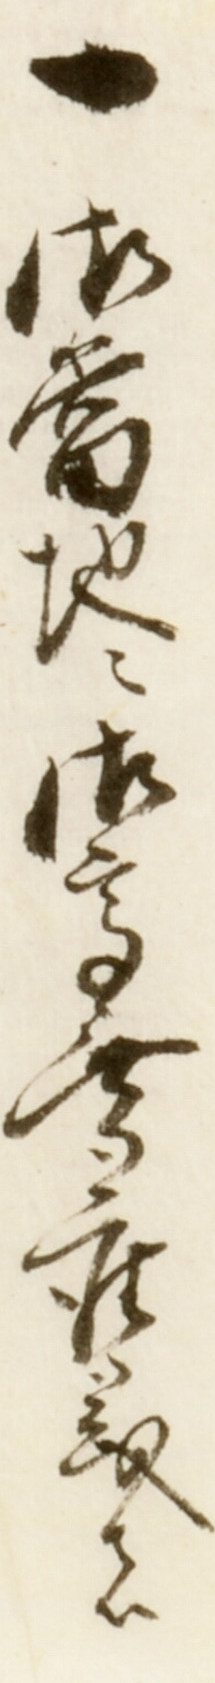一御当地ニ御高無御座御義者
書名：諸事書上
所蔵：伊那市立高遠町図書館・合同会社AMANE
